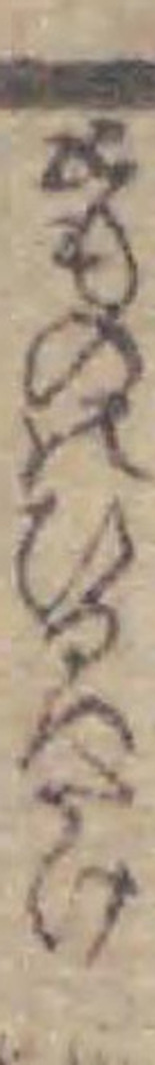どもののびるはたけ
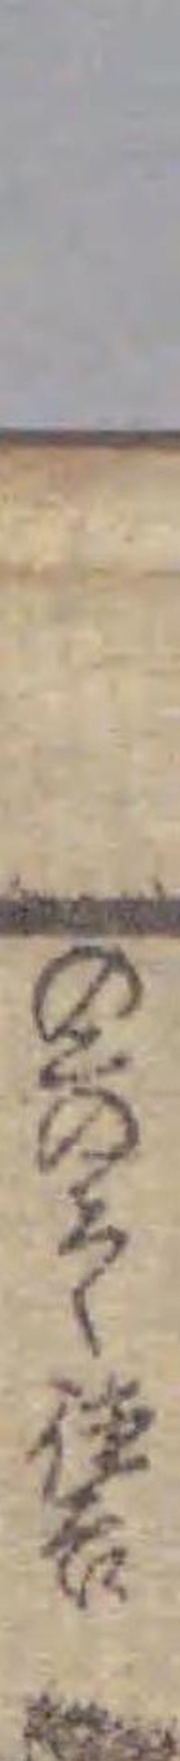のこのごとく徳吉
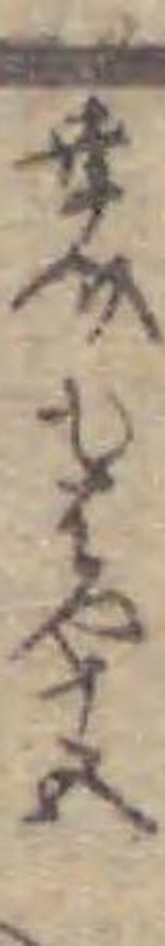幸介もはや十五
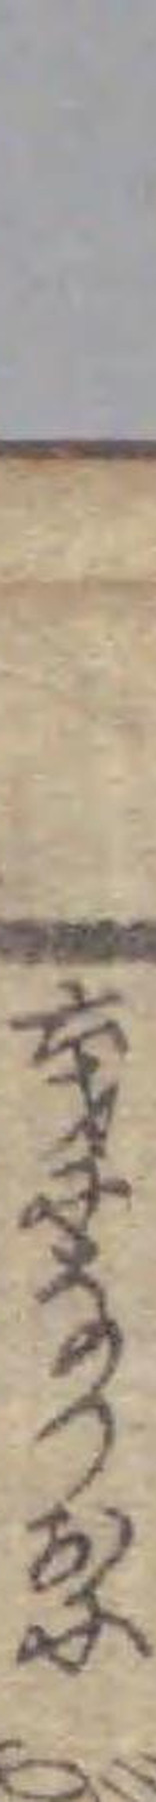六才になりおに
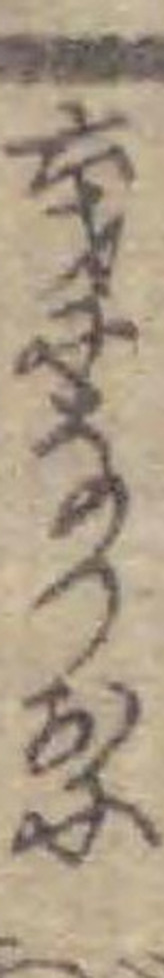六才になりおに
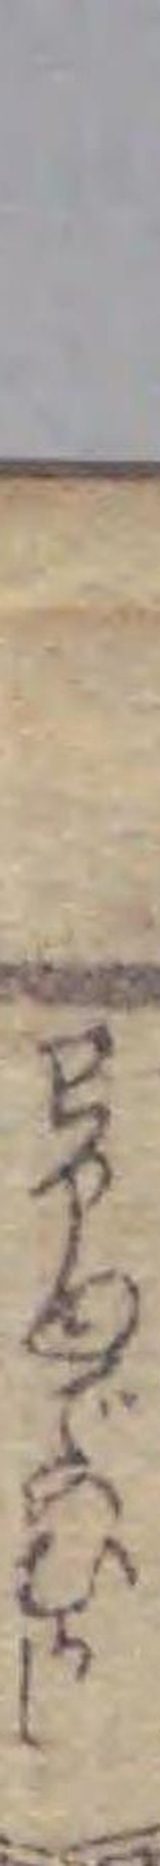わかしゆではむかし
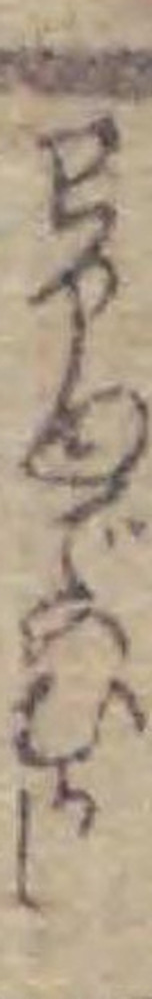わかしゆではむかし
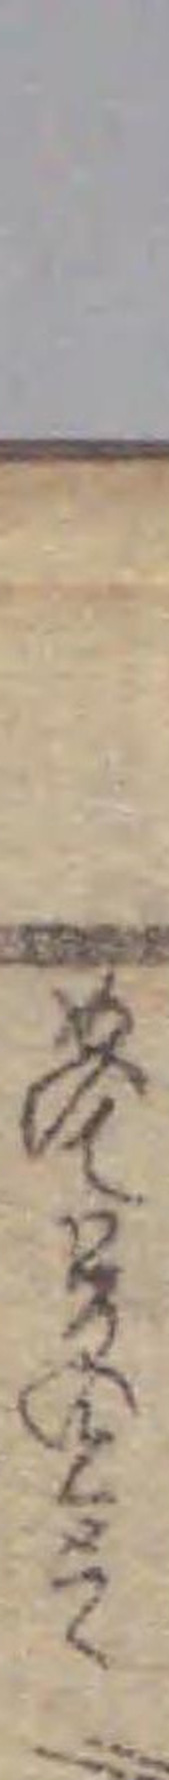めいてわるいととく
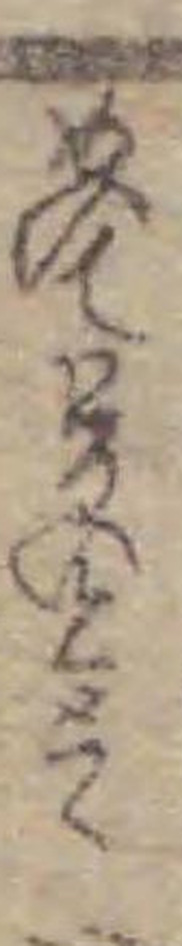めいてわるいととく
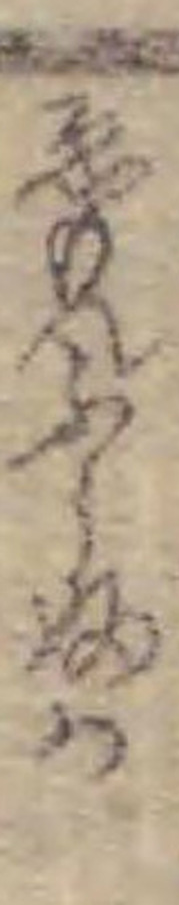ゑもんふうふが
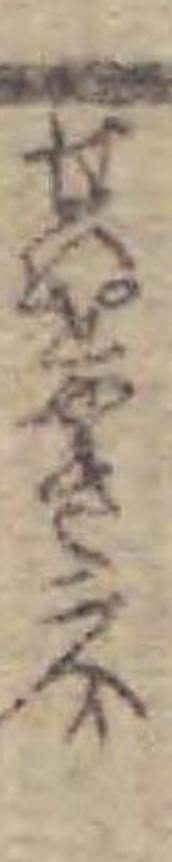せはをやき二人り
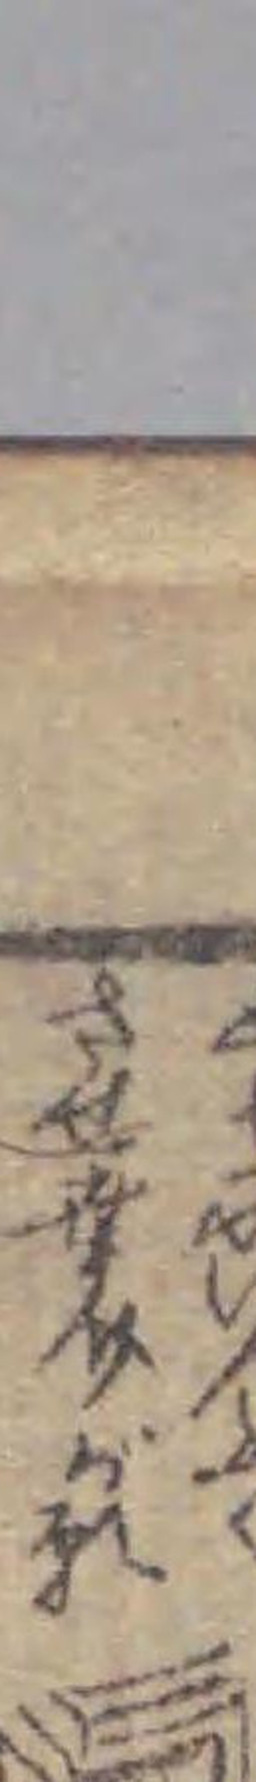させ幸介が願
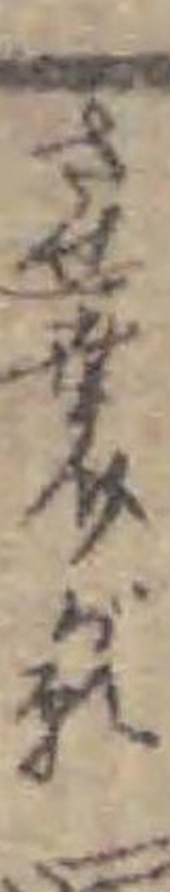させ幸介が願
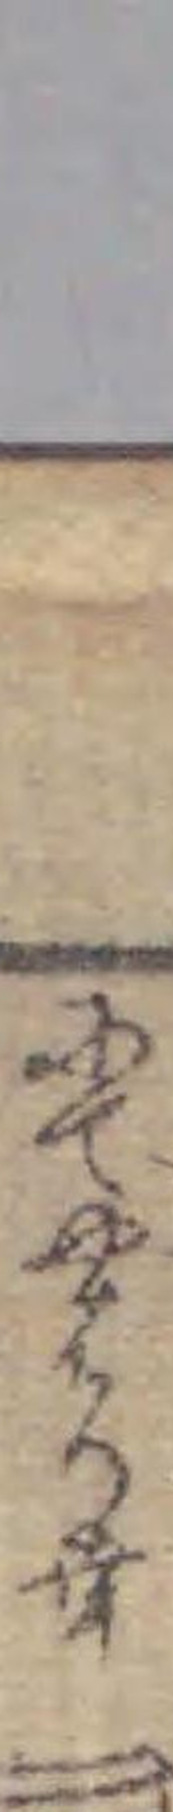にてやはり幸
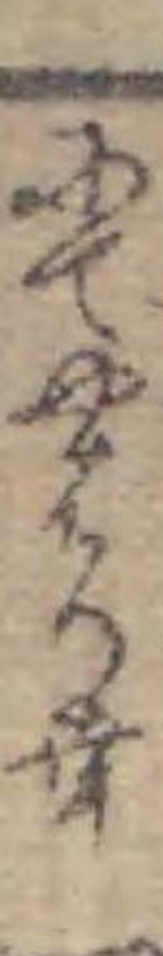にてやはり幸
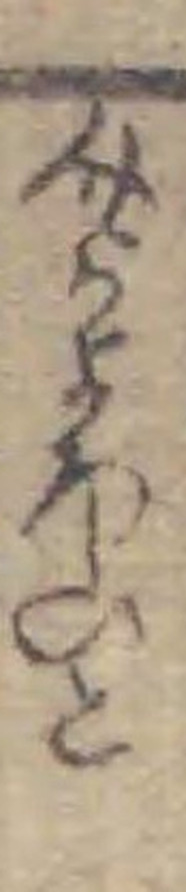介がよろしいと
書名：通風伊勢物語 : 3巻
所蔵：国立国会図書館 National Diet Library, JAPAN
